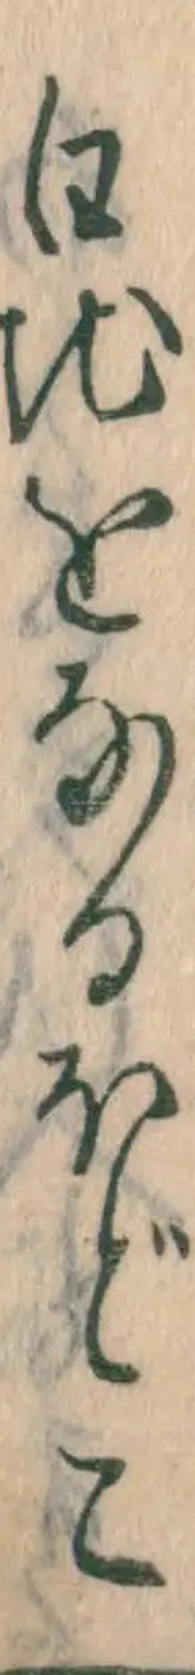白地をなるほどこ
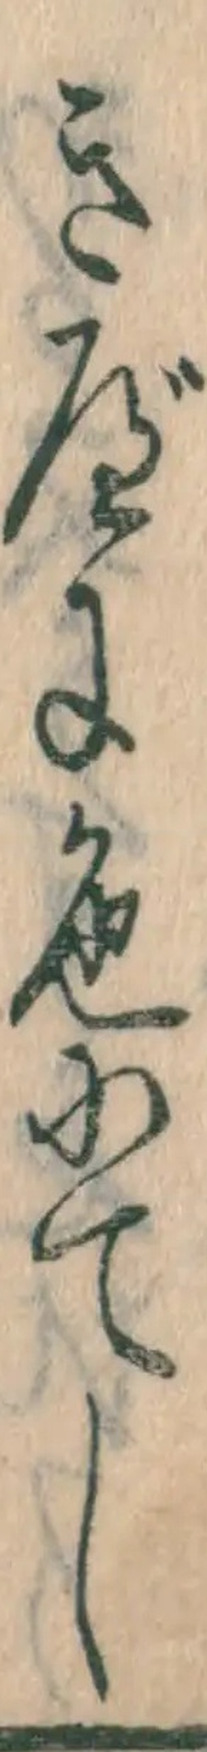きべに色にてし

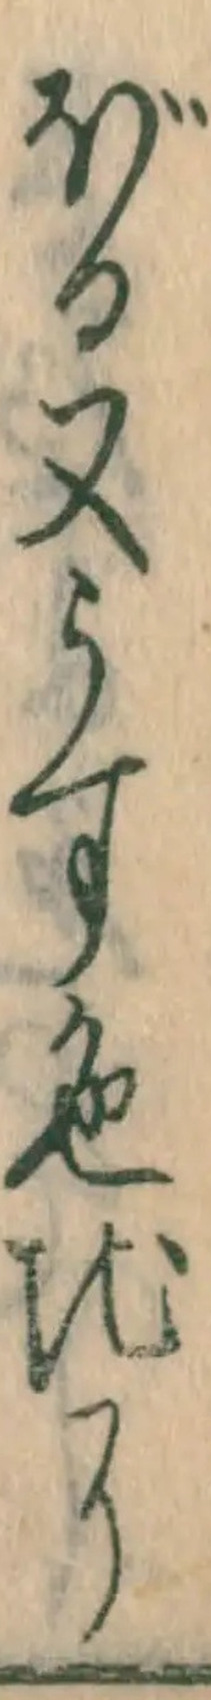ぼる又うす色地に
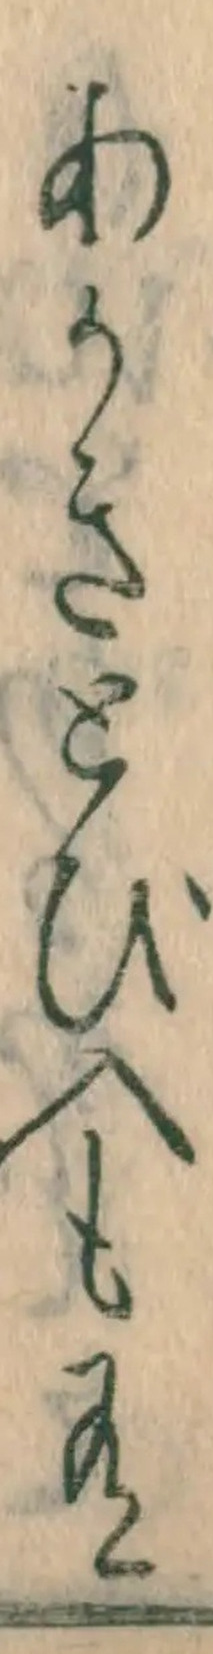あかきとび入も有
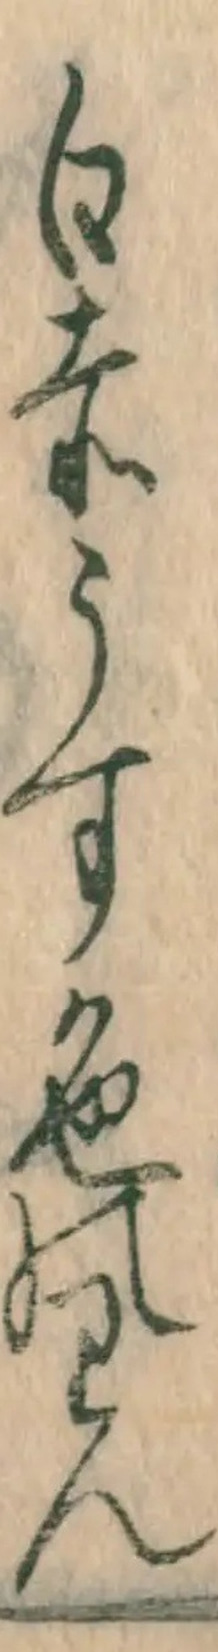白赤うす色のりん
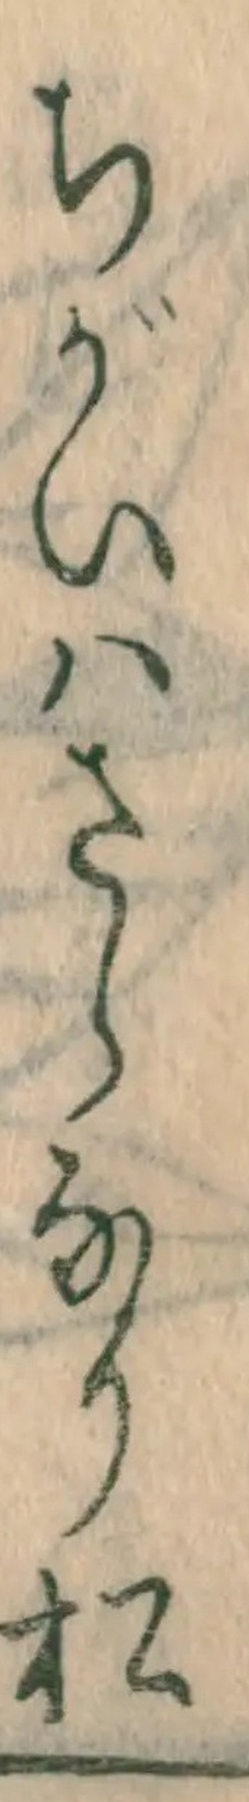ちがいはさらなり松
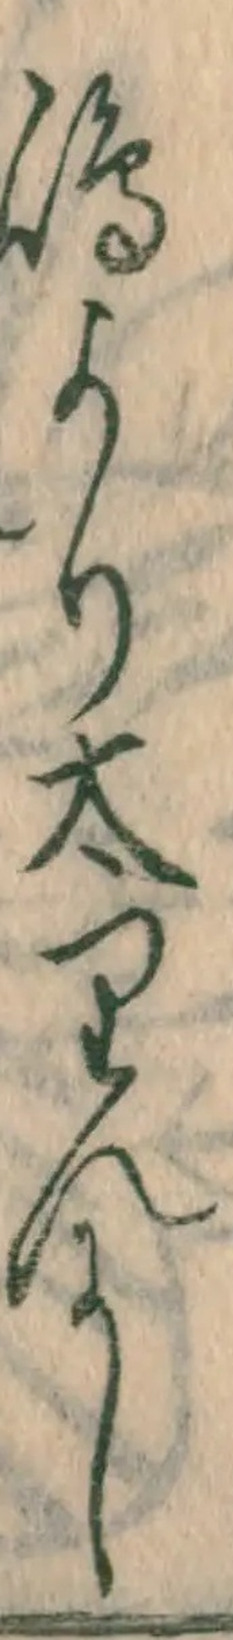嶋より太りんにし
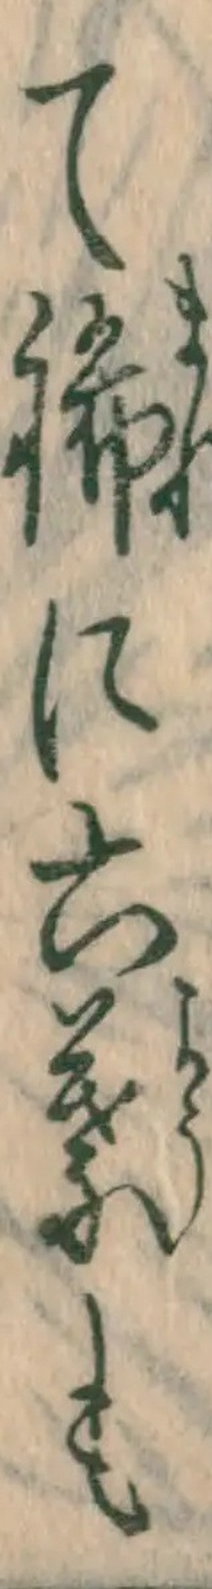て稀に六葉も
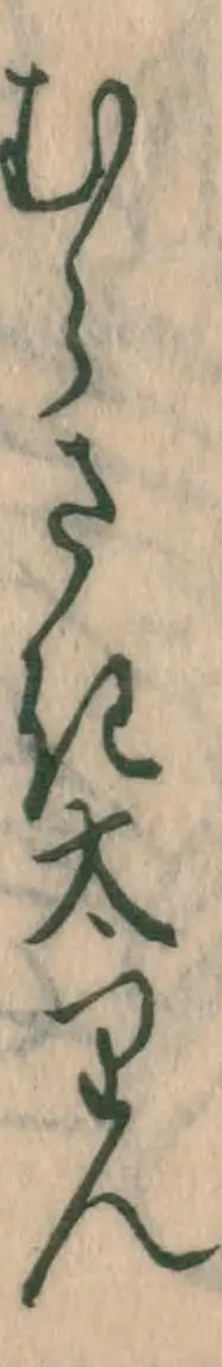むらさき太りん
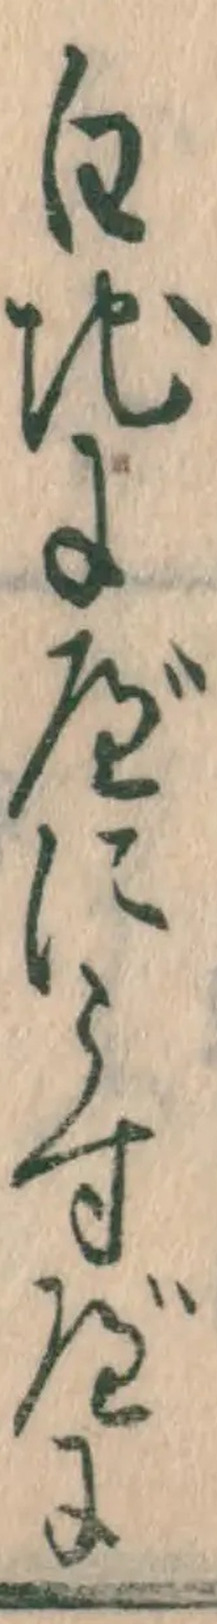白地にべにうすべに
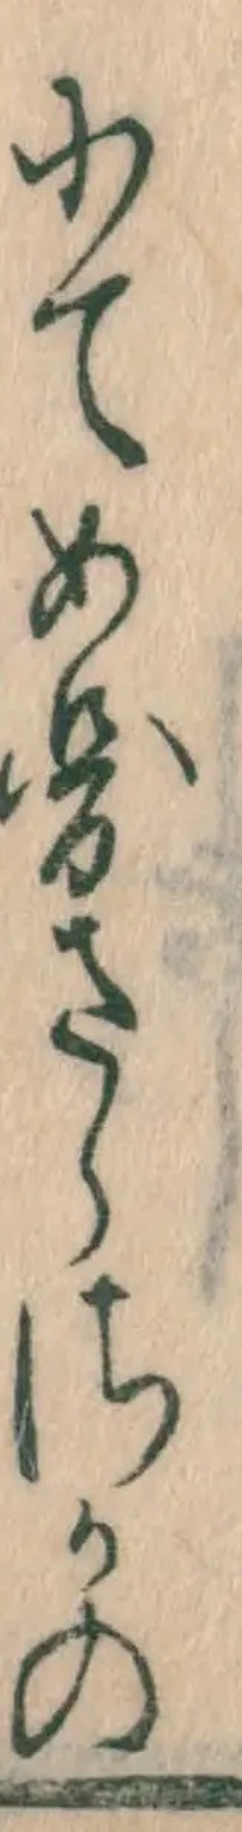にて如図さらさかの
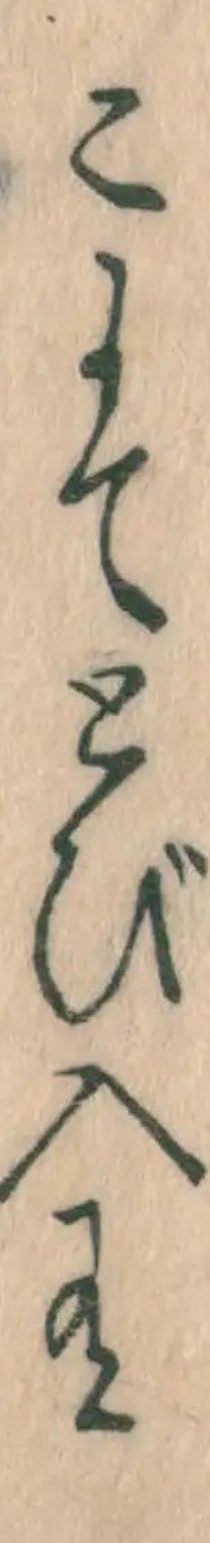こにてとび入有

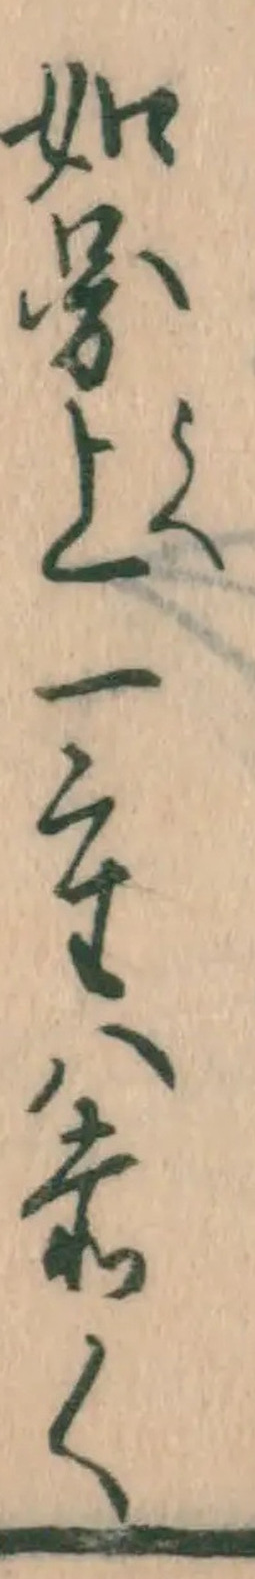如図上一重は赤く
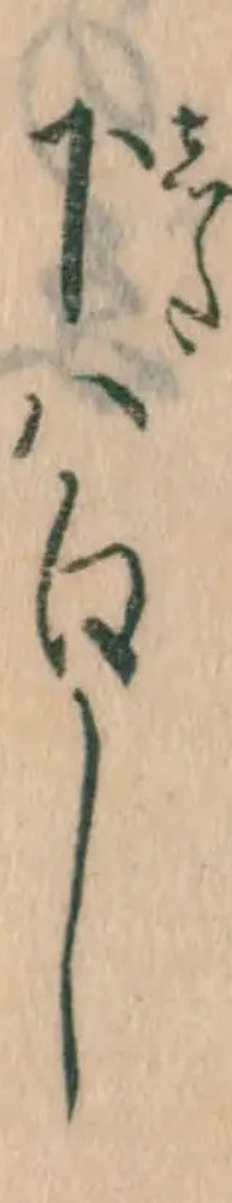下は白し
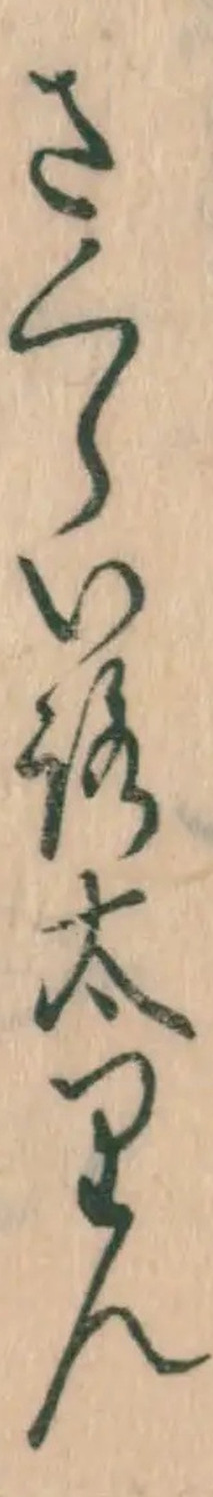さくらいろ太りん
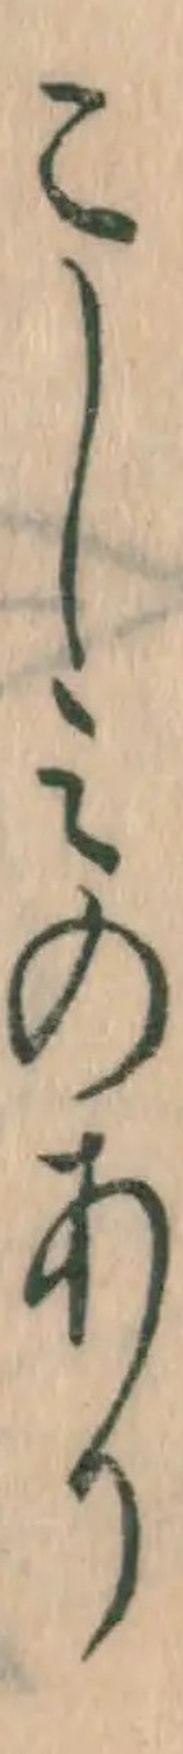こしみのあり
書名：錦繍枕 5巻. [5]
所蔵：国立国会図書館 National Diet Library, JAPAN
